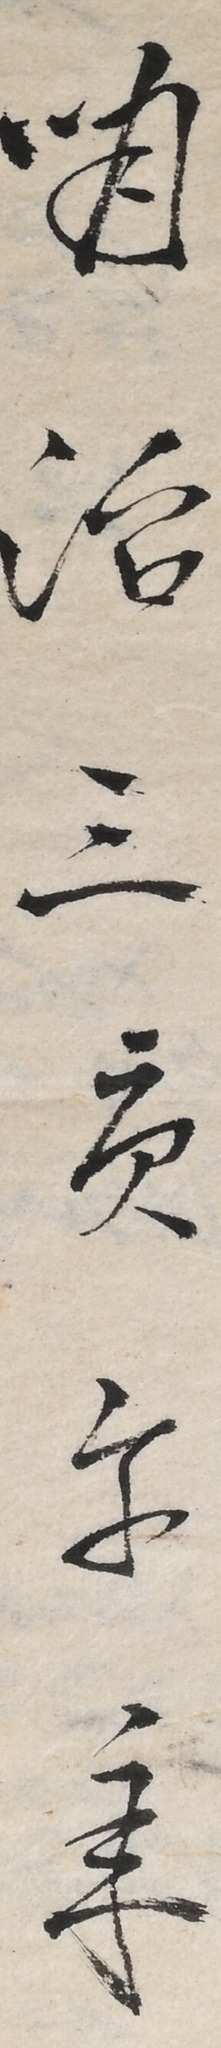明治三庚午年
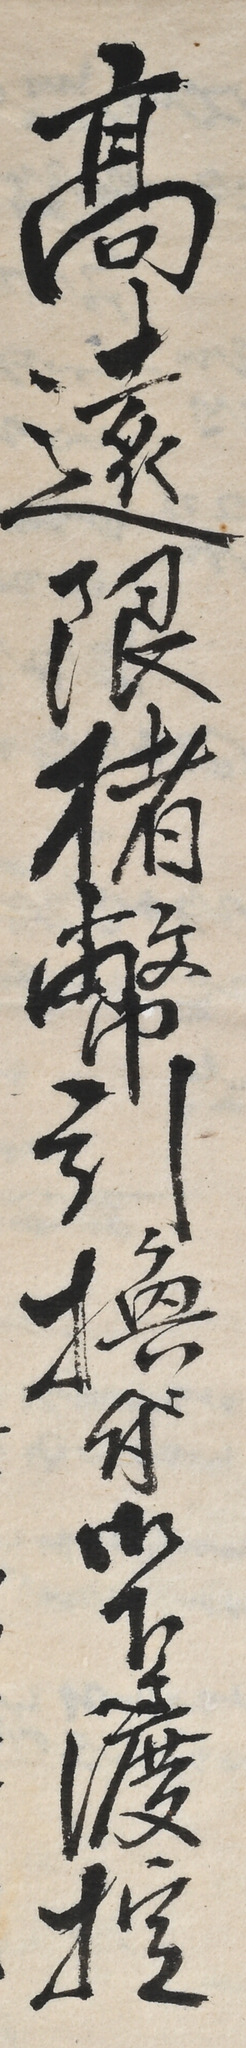高遠限楮幣引換ニ付御下ケ渡控
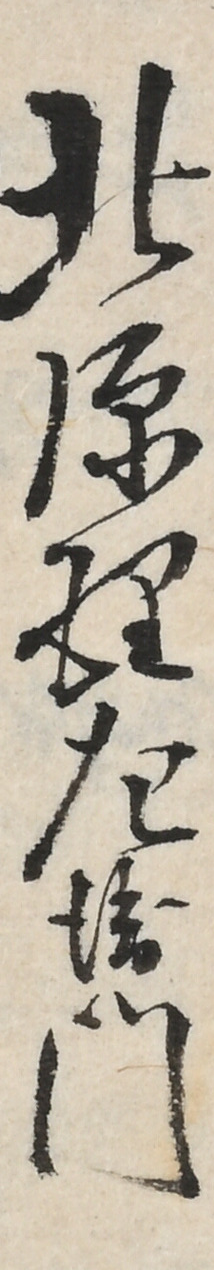北原理左衛門

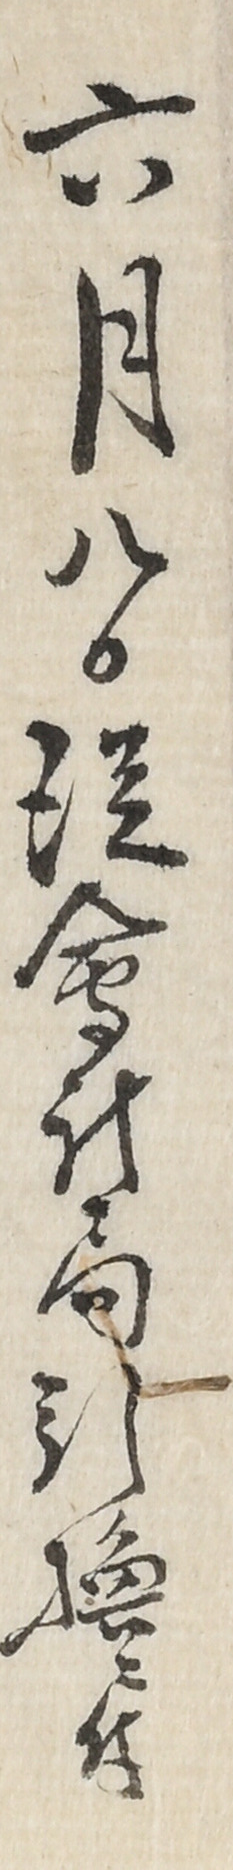六月八日従会計局引換ニ付
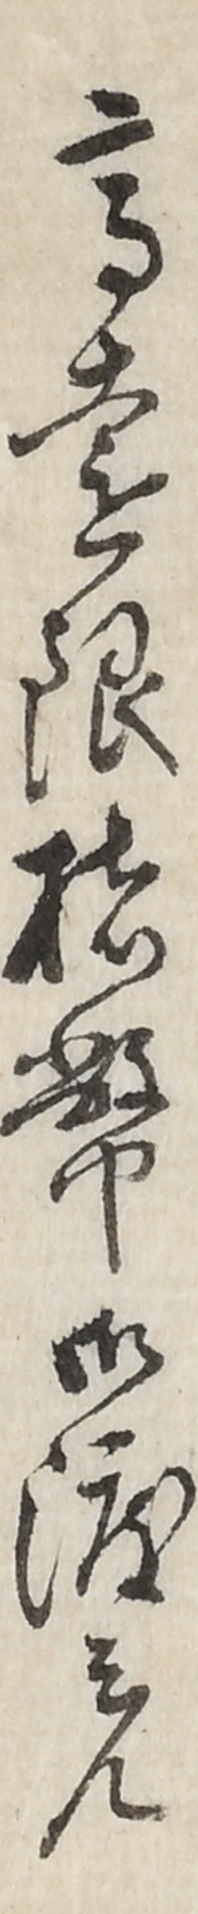高遠限楮幣御渡覚
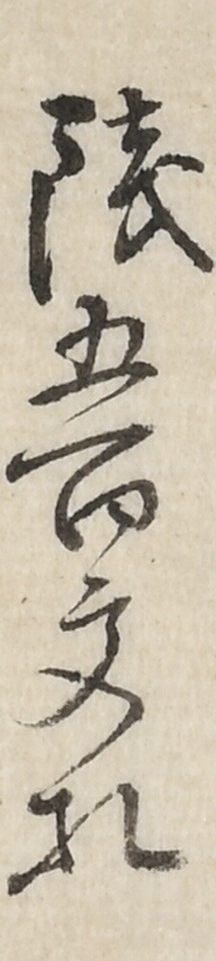銭五百文札
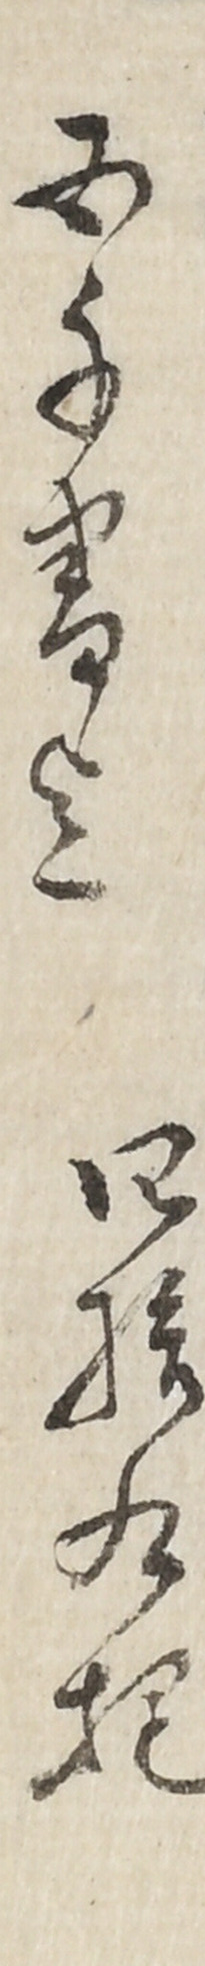五千番迄四拾九把
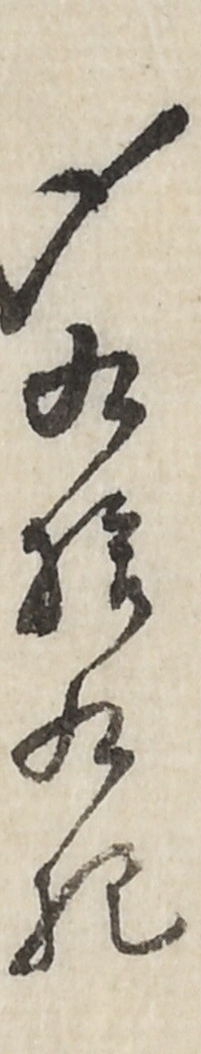〆九拾九把
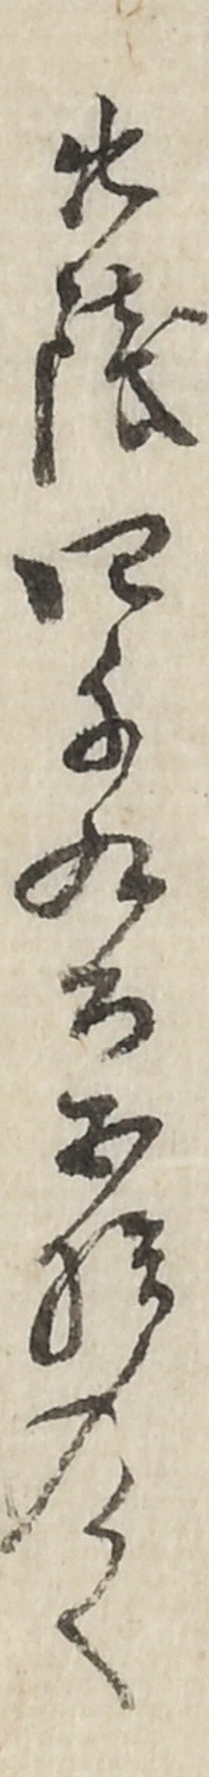此銭四千九百五拾〆文
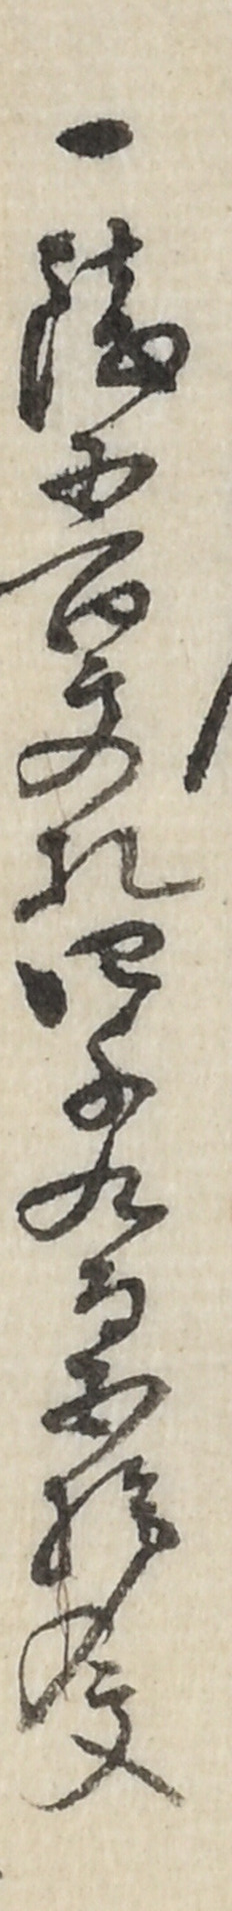一銭五百文札四千九百五拾〆文
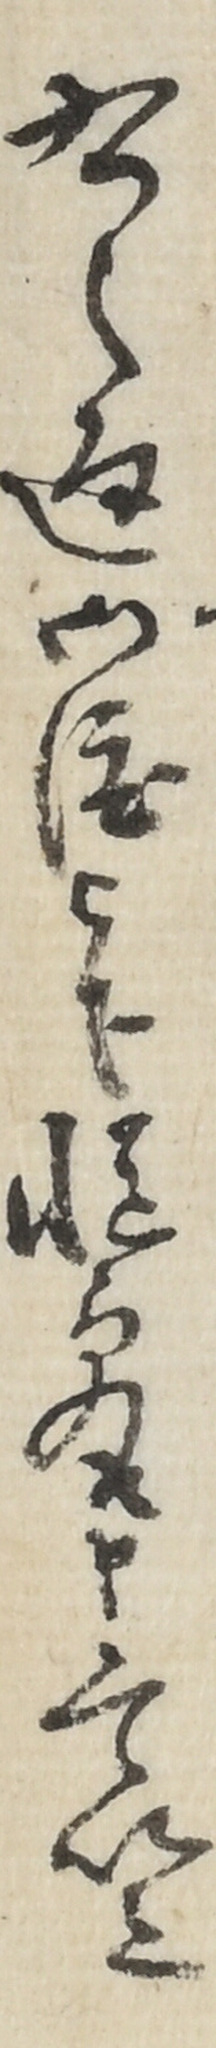右之通御渡被下慥受取申上候以上
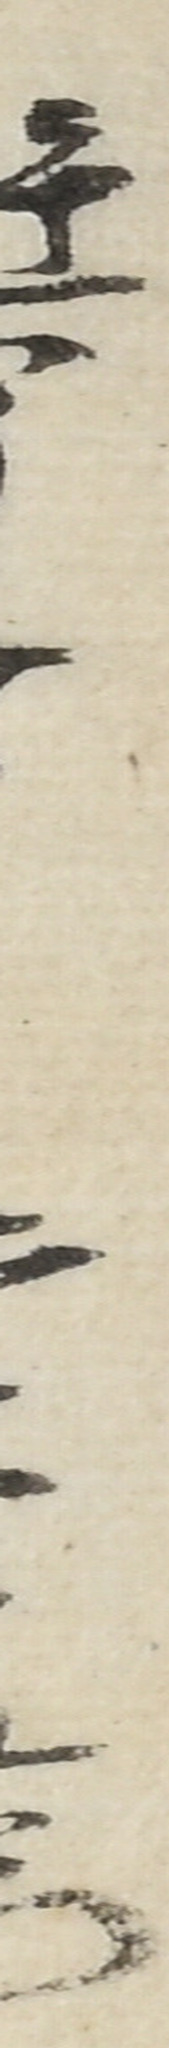午六月八日池上金左衛門

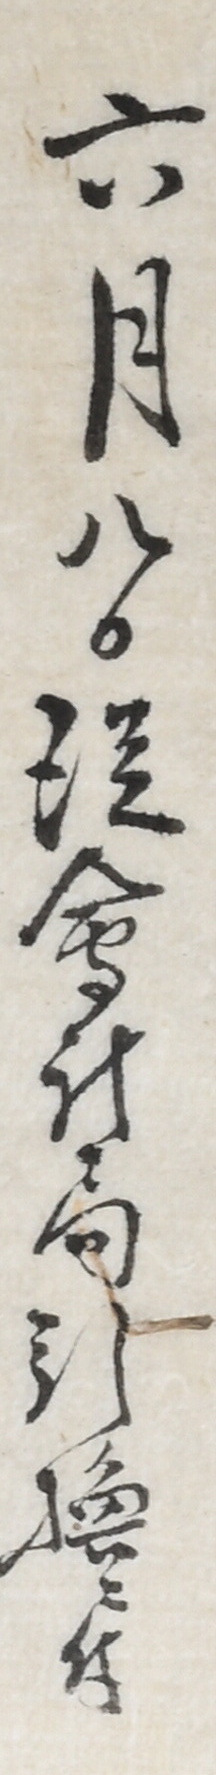六月八日従会計局引換ニ付
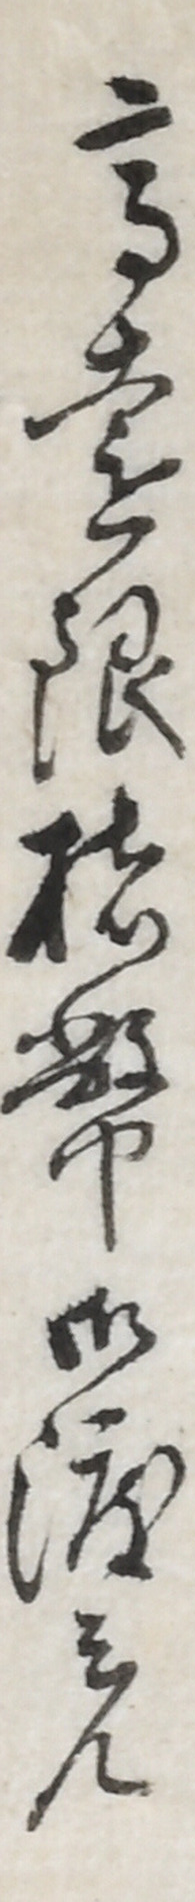高遠限楮幣御渡覚
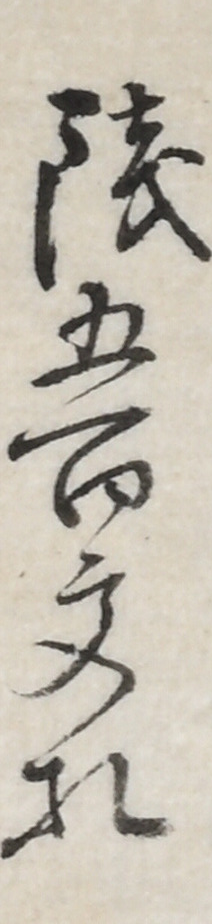銭五百文札
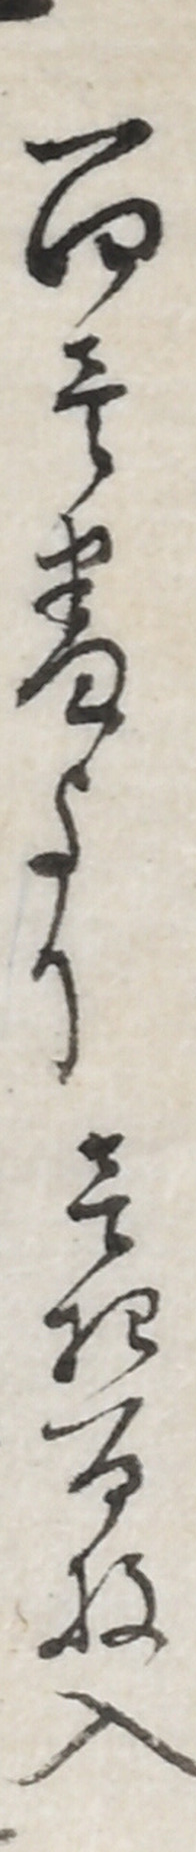一百壱番より壱把百枚入
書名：髙遠限楮幣引換ニ付御下ケ渡控
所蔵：伊那市立高遠町図書館・合同会社AMANE
